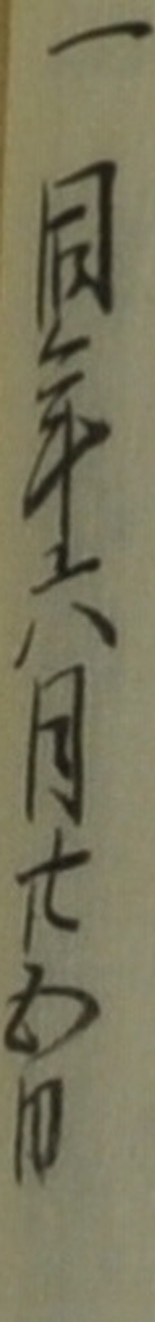一同年六月廿五日
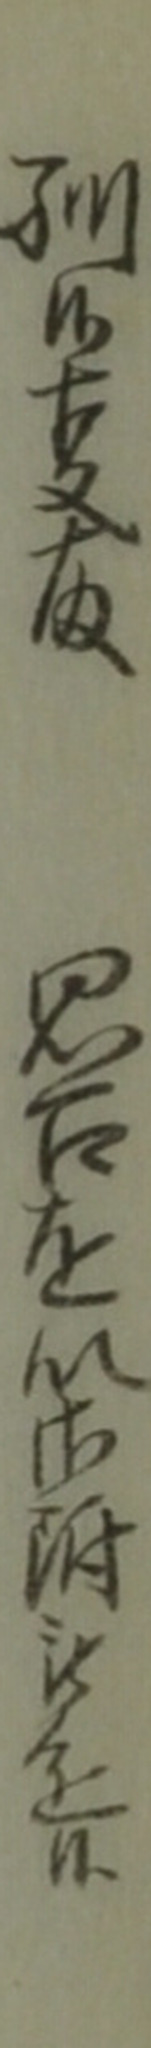馴候事藤思召を以御附被進候
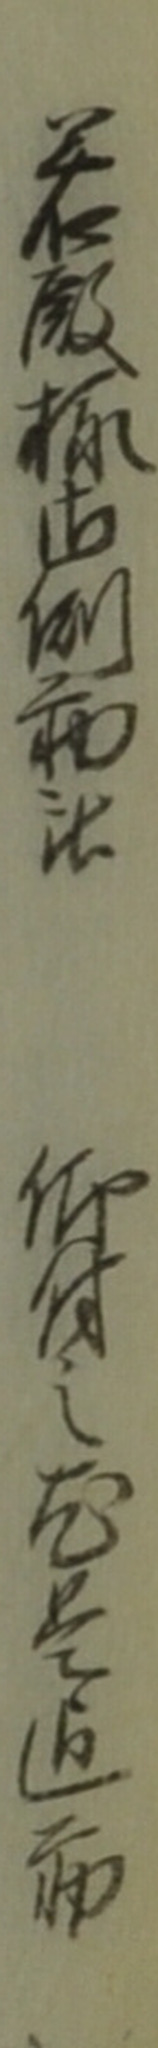若殿様御側勤被仰付之尤是迄勤
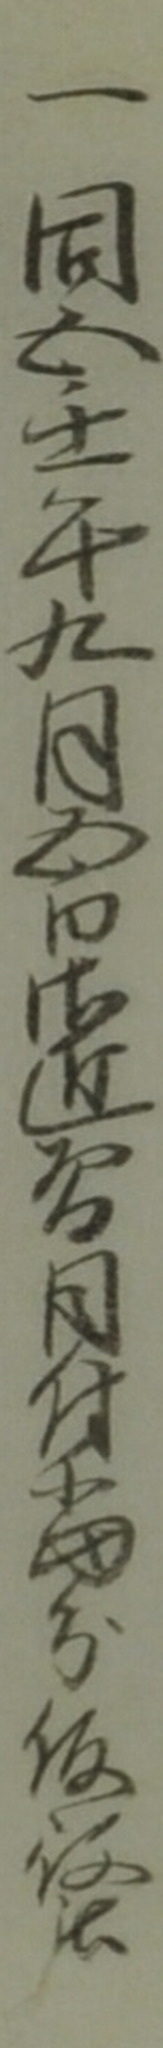一同五壬午九月五日御近習目付当分仮役被
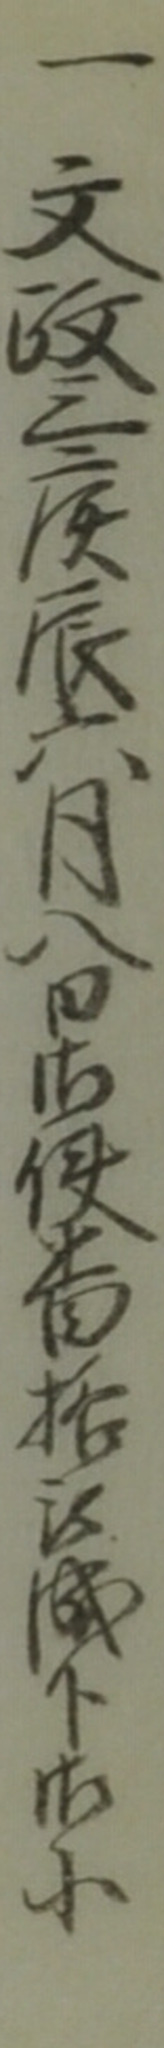一文政三庚辰六月八日御使番格被成下御小
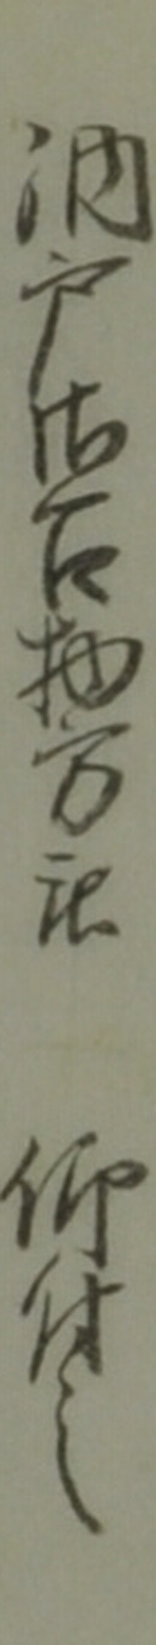納戸御召物被仰付之
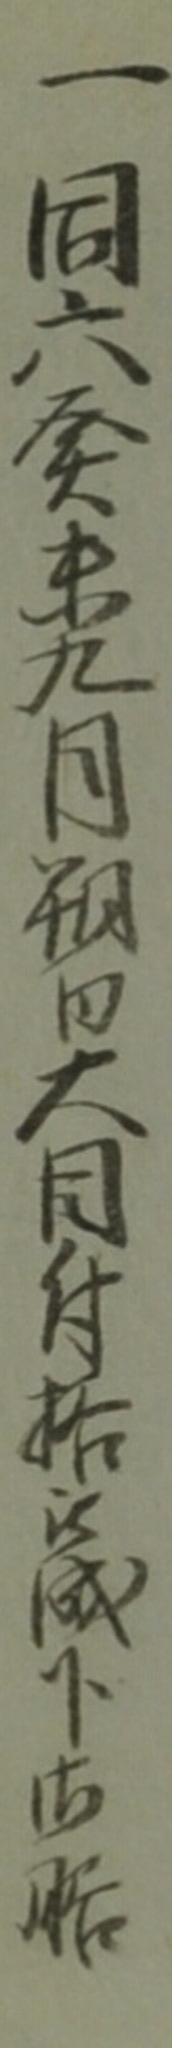一同六癸未九月朔日大目付格被成下御膳
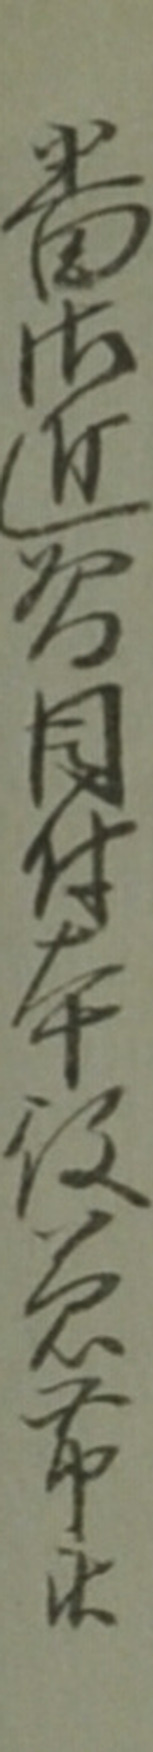番御近習目付本役兼帯被
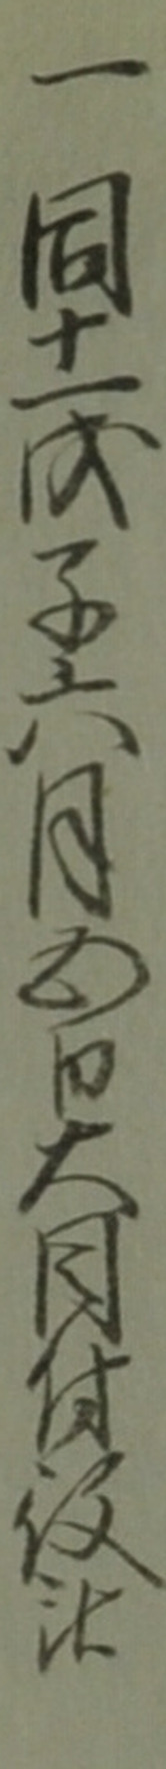一同十一戊子六月五日大目付役被
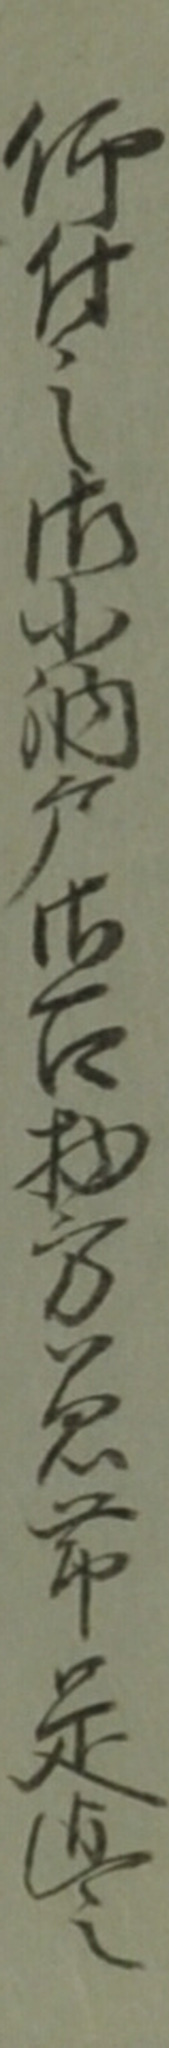仰付之御小納戸御召物方兼帯是迄之
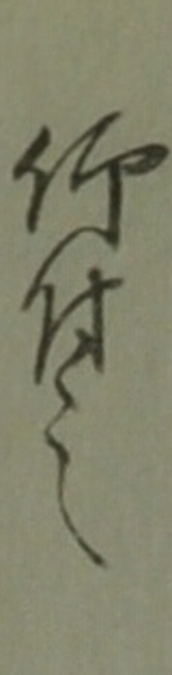仰付之
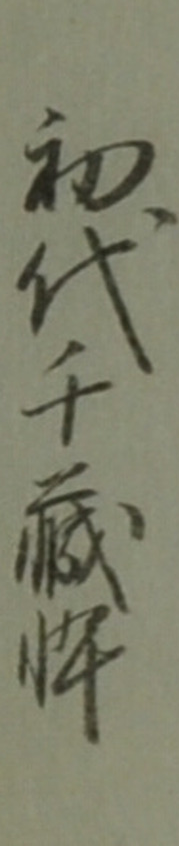初代千蔵忰
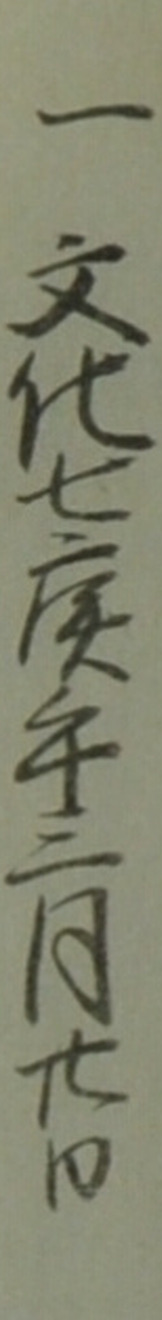一文化七庚午三月廿日
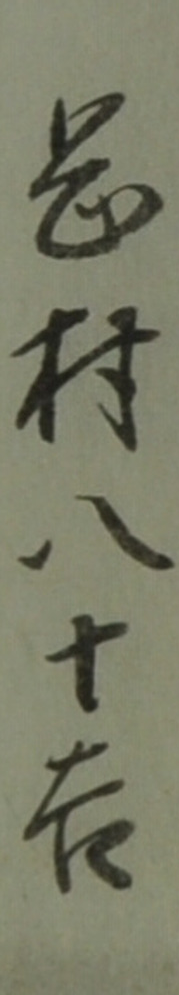岡村八十吉
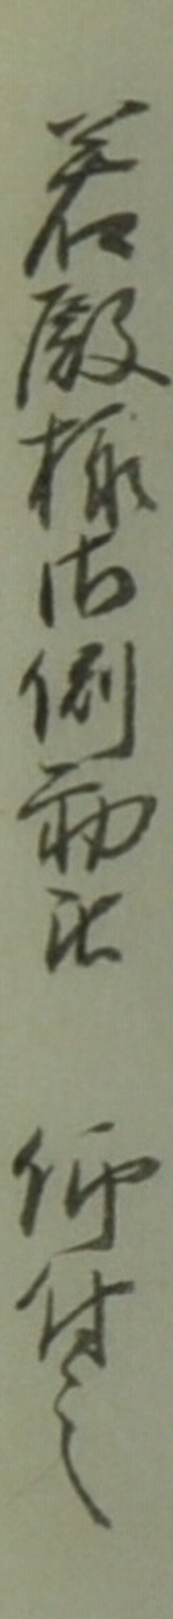若殿様御側勤被仰付之

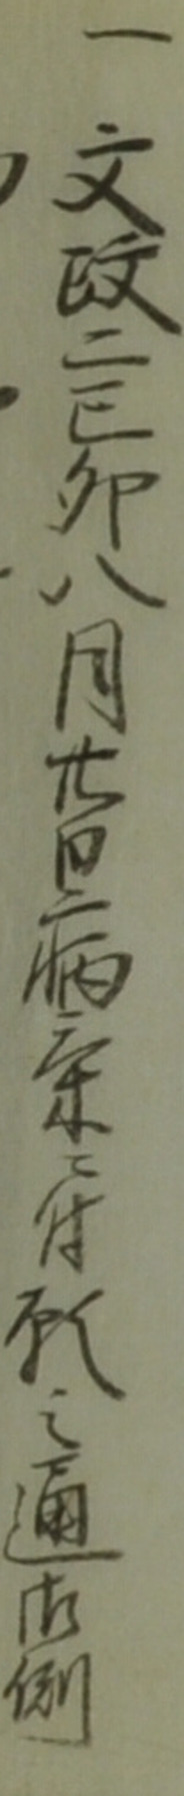一文政二己卯八月廿日病気ニ付願之通御側
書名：諸御役代々録（五）
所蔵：伊那市立高遠町図書館・合同会社AMANE
